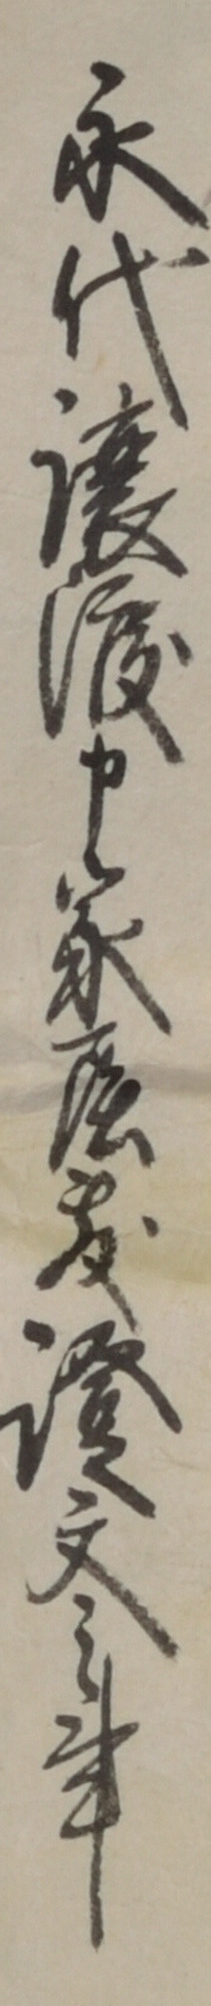永代譲渡申家屋敷証文之事
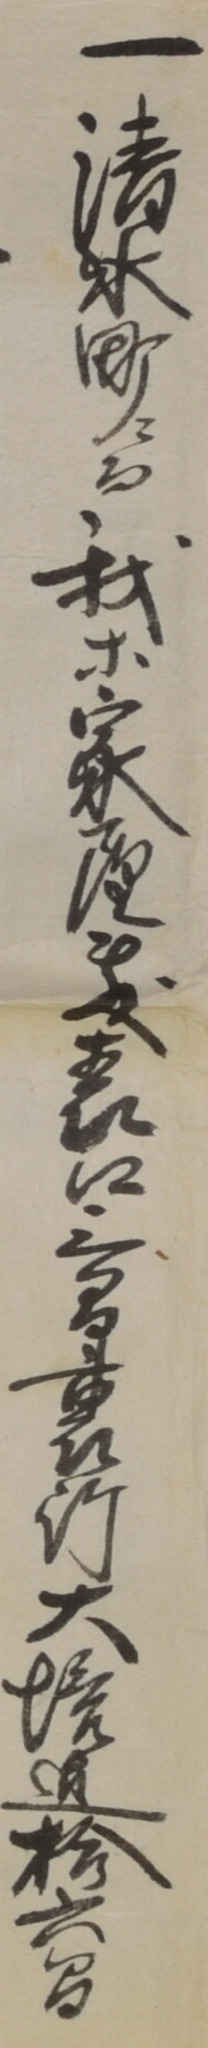一清水町ニ而我等家屋敷表口三間裏行大境迄拾六間
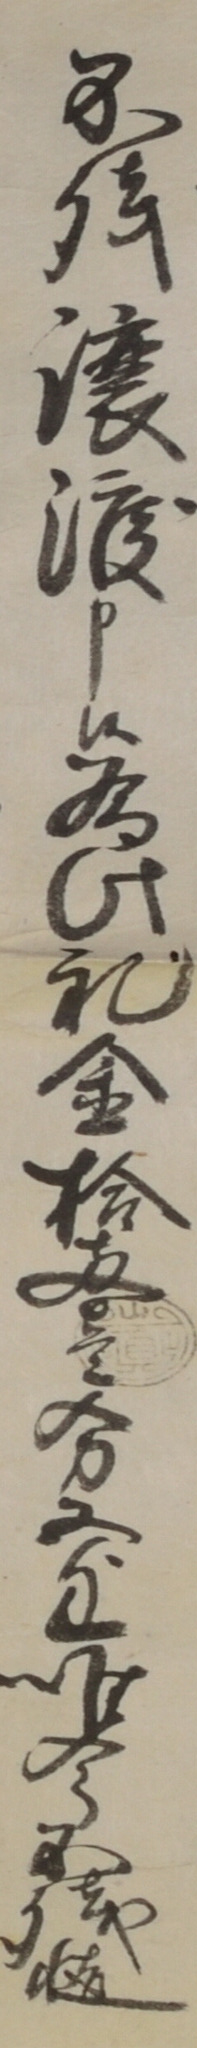不残譲渡申候為此礼金拾両壱分五り唯今不残慥
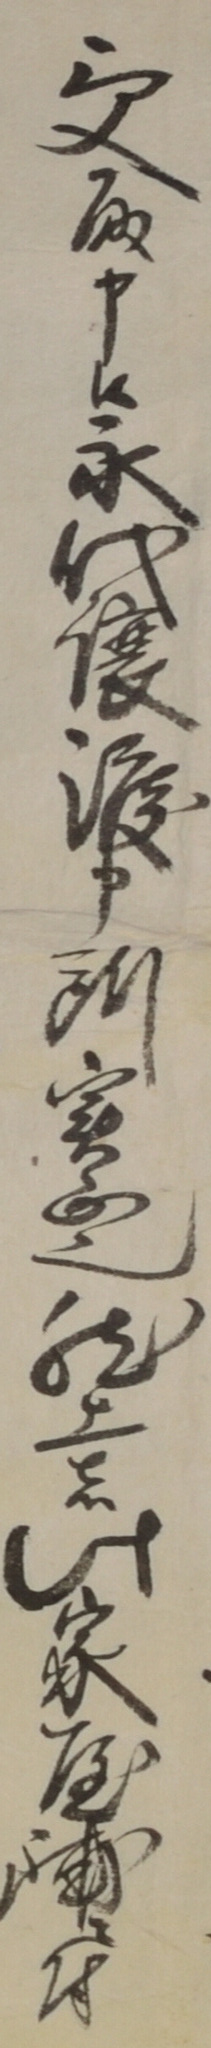受取申候永代譲渡申所実正也然上者此家屋鋪ニ付
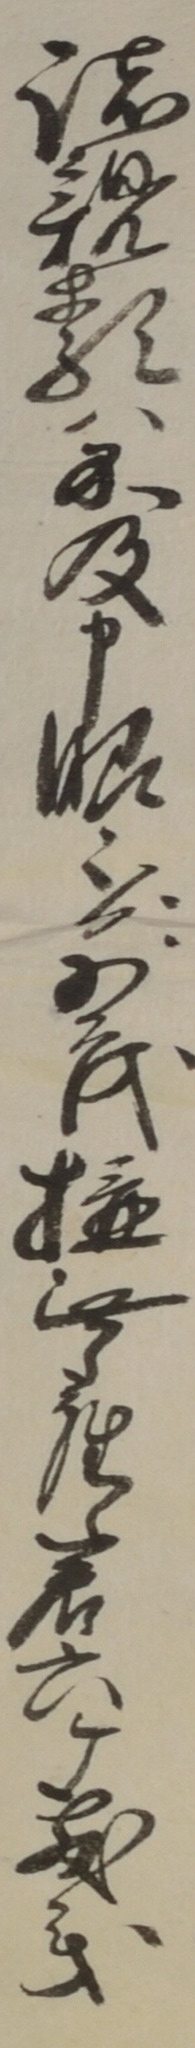諸親類ハ不及申脇々ゟ少茂構無御座候若六ケ敷義
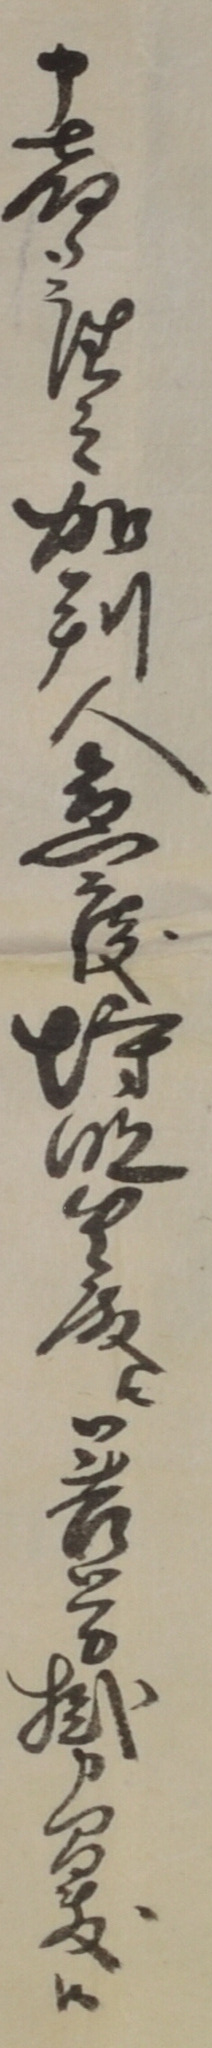申者御座候ハゝ加判人急度埒明貴殿江御苦労掛申間敷候
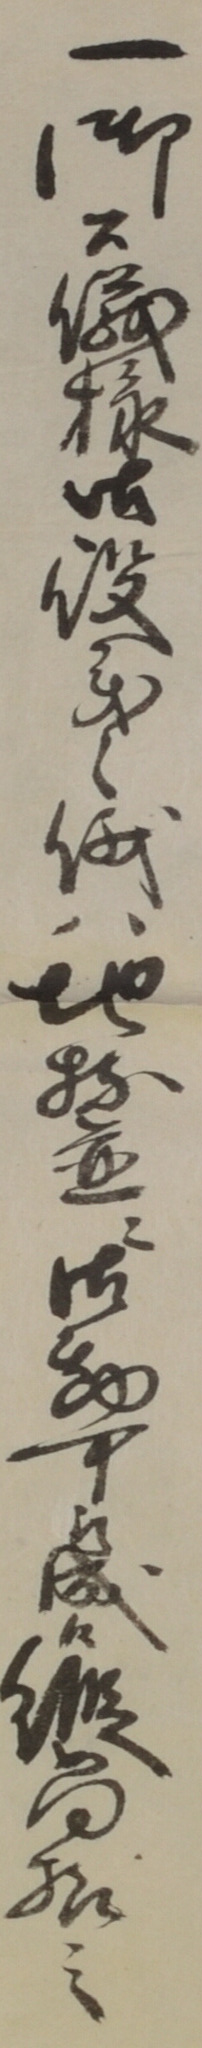一御公儀様御役義之儀ハ地持並ニ勤可被成候縦如何様之
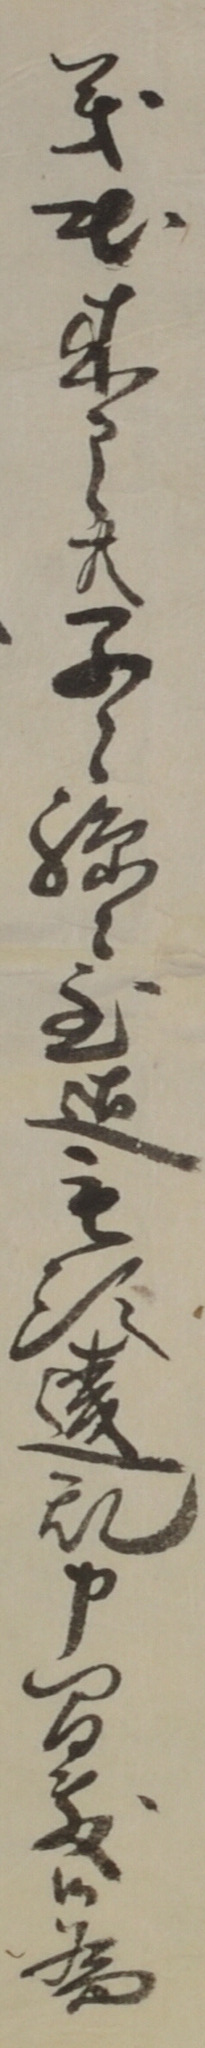義出来申候共子々孫々至迄毛頭違乱申間敷候為
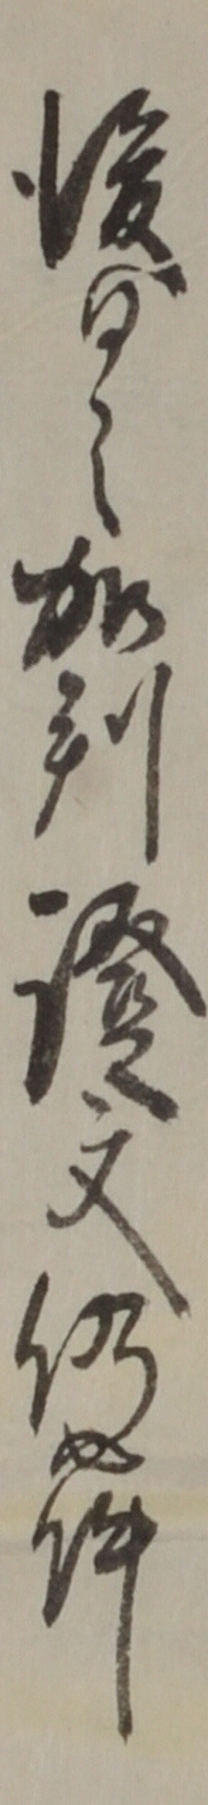後日之加判証文仍如件
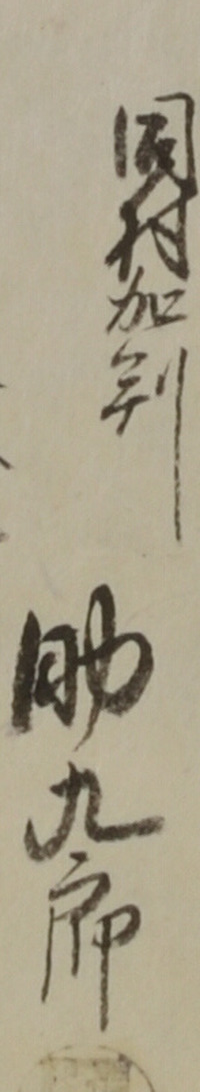同村加判助九郎印
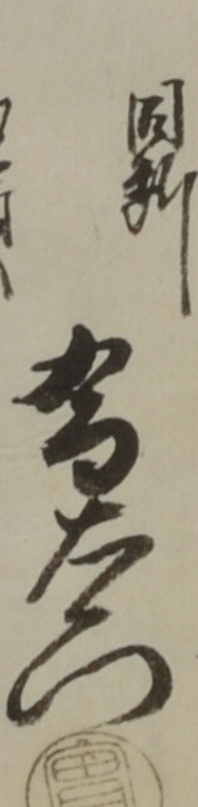同断金右衛門㊞
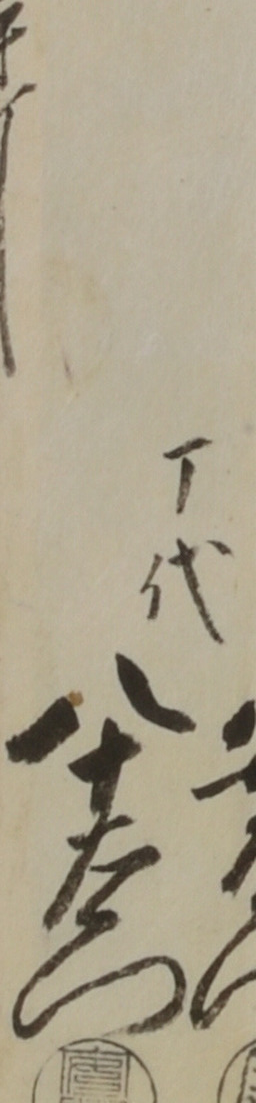丁代八十右衛門㊞
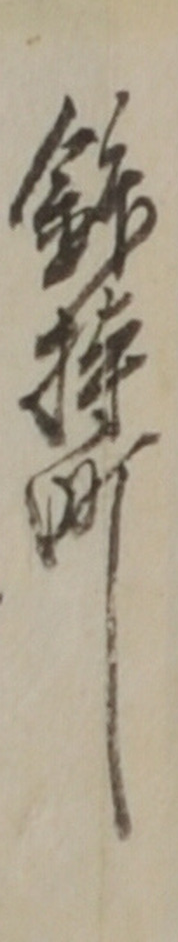鉾持町
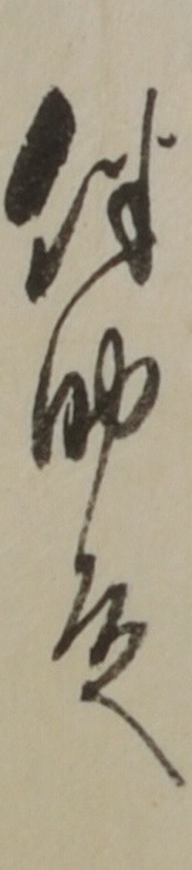伴助殿
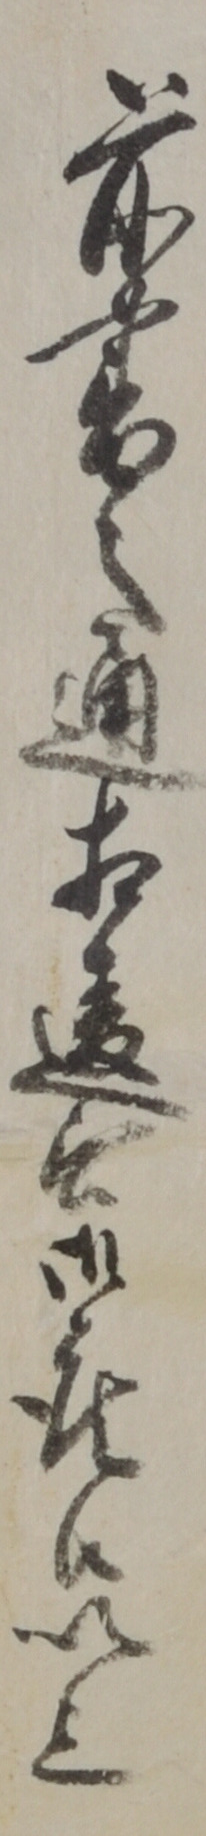前書之通相違無御座候以上
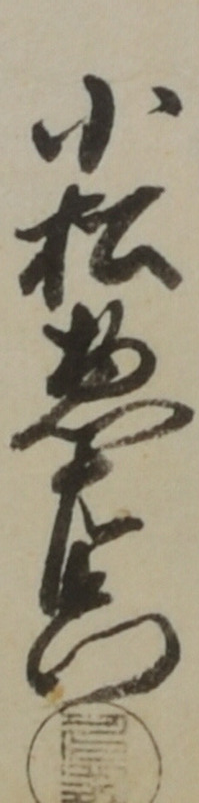小松惣右衛門㊞
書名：永代譲渡申家屋敷証文之事
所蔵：伊那市立高遠町図書館・合同会社AMANE
